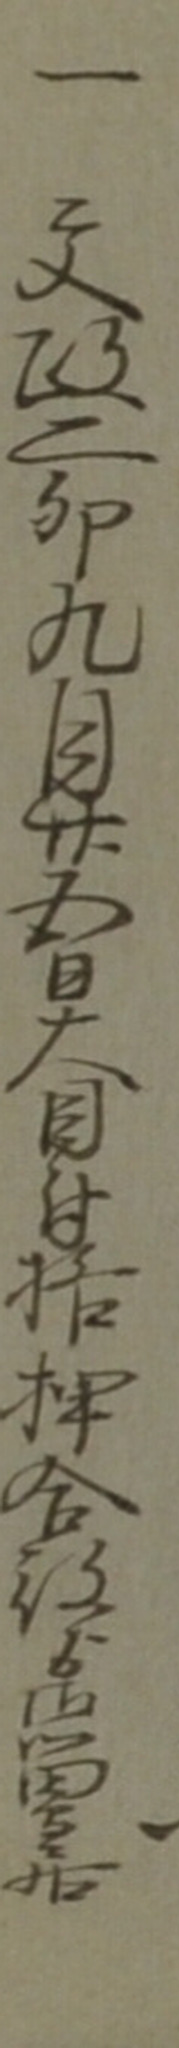一文政二卯九月廿五日付格押合役ゟ御留守居
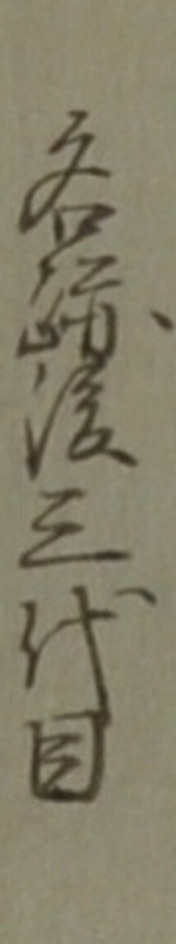名跡後三代目
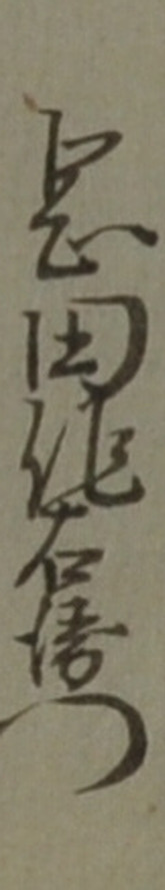岡田作右衛門
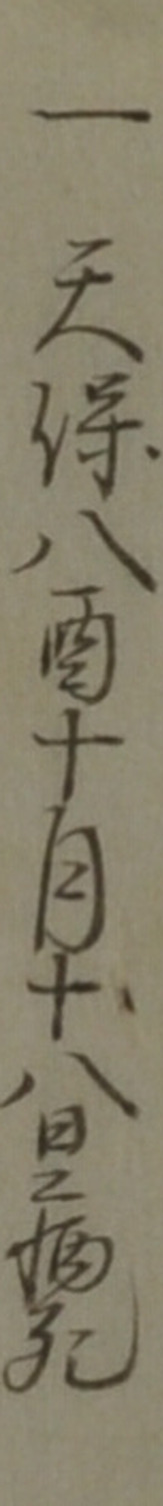一天保八酉十月十八日病死
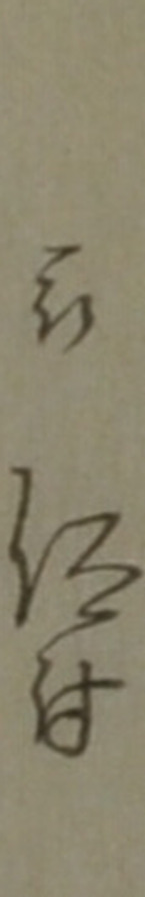被仰付
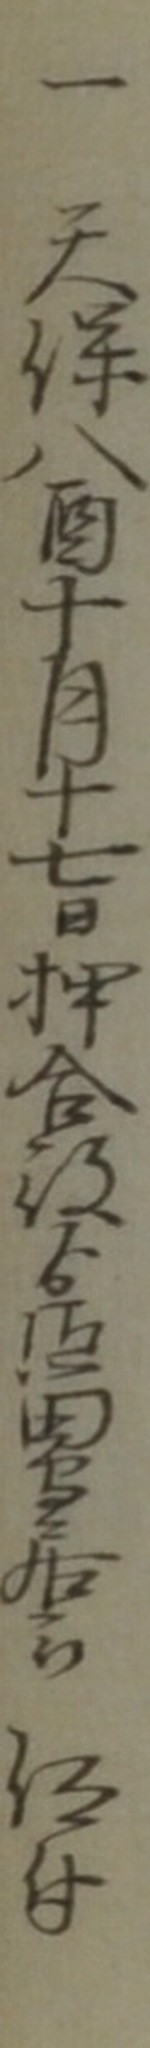一天保八酉十月十七日押合役ゟお留守居被仰付
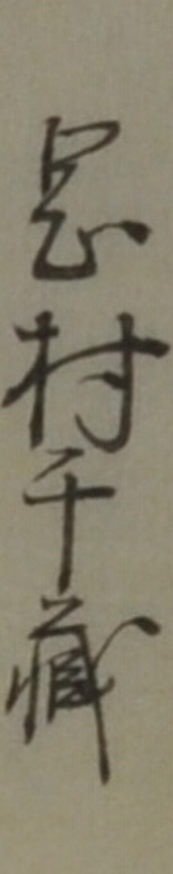岡村千蔵
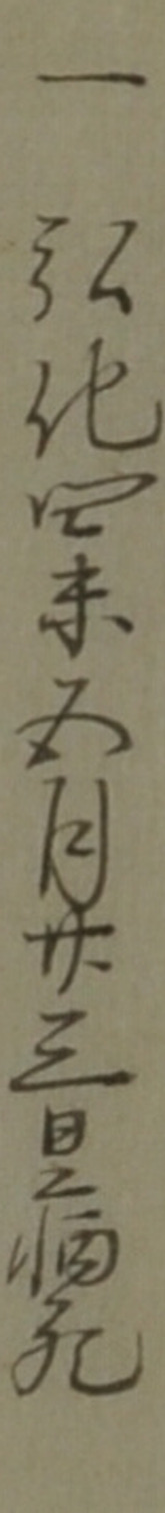弘化四未五月廿三日病死
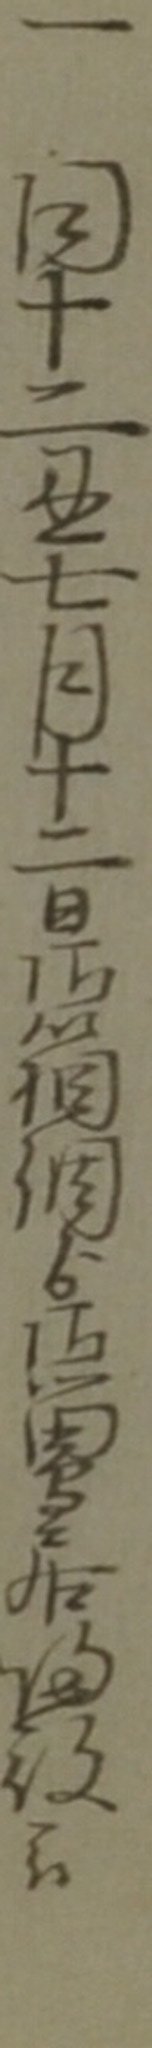同十二丑七月十二日御箱調ゟ御留守居帰役被
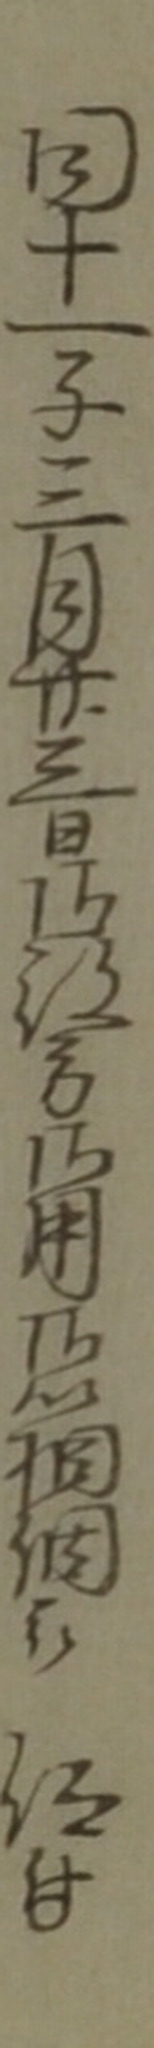同十一子三月廿三日御役方御用御箱調被仰付
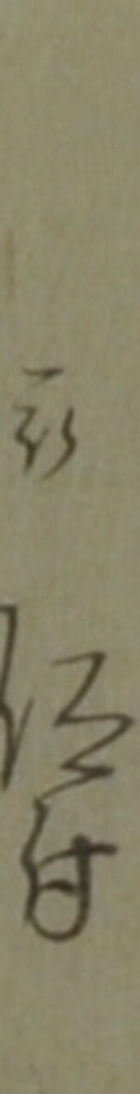被仰付
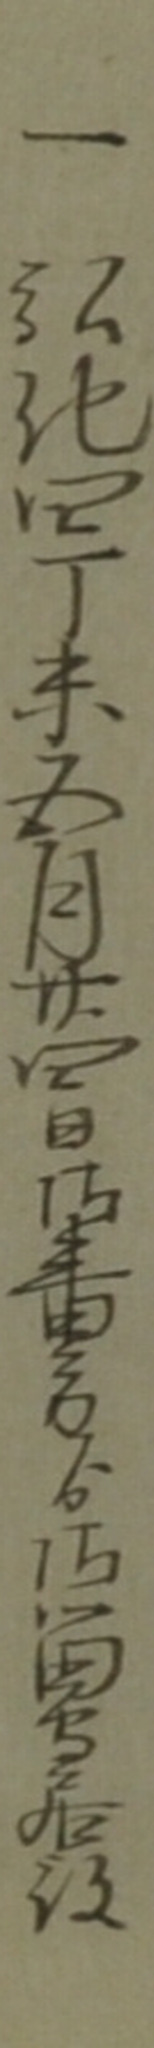一弘化四丁未五月廿四日御番方ゟ御留守居役
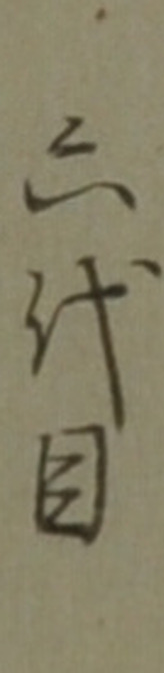六代目
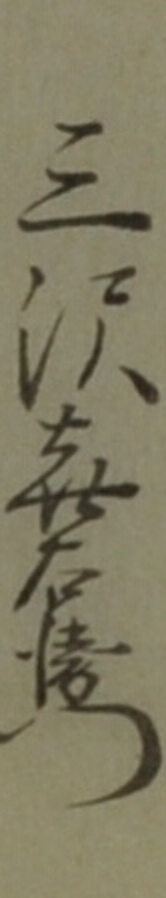三沢喜右衛門
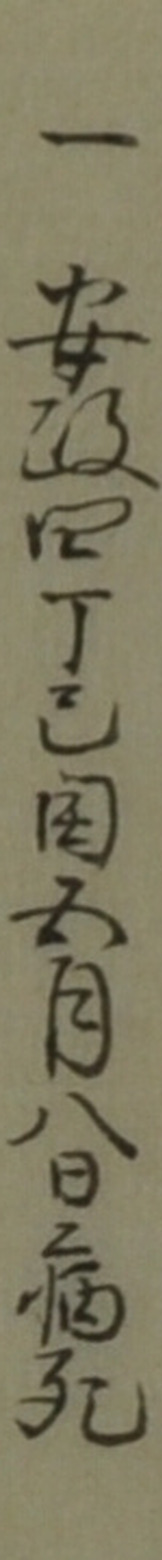一安政四丁巳閏五月八日病死
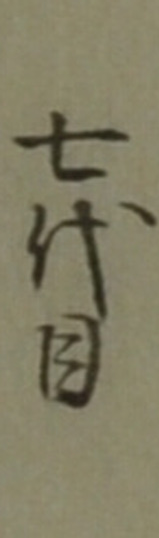七代目
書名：諸御役代々録（三）
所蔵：伊那市立高遠町図書館・合同会社AMANE
